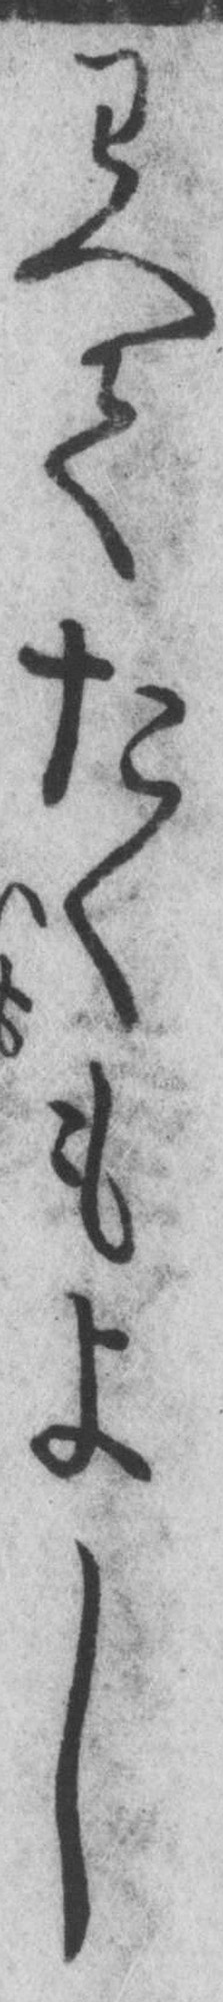わへてたくもよし
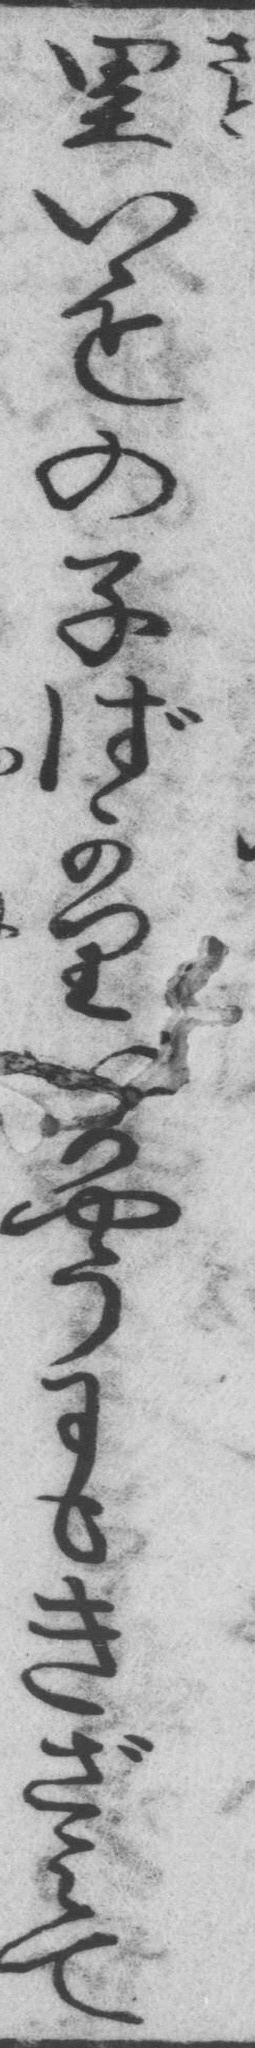里いもの子ば可里かやう尓もきざみて
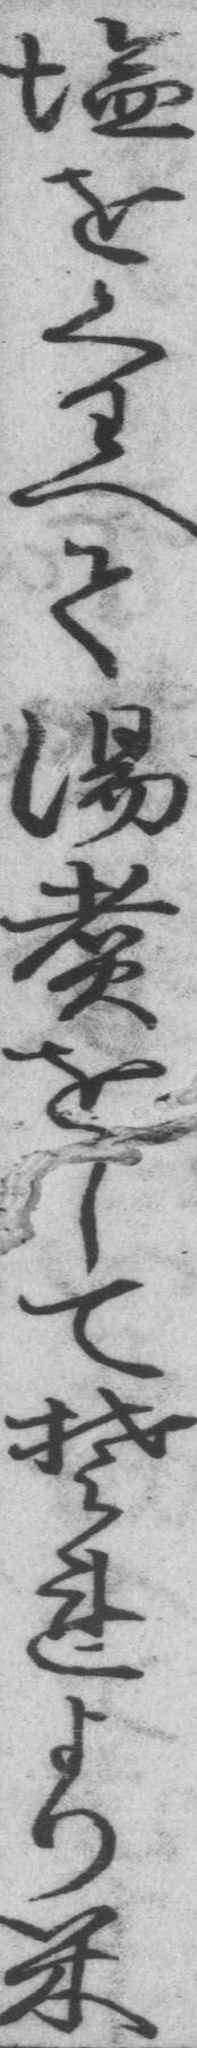塩をくわへて湯煮をして楚連より米
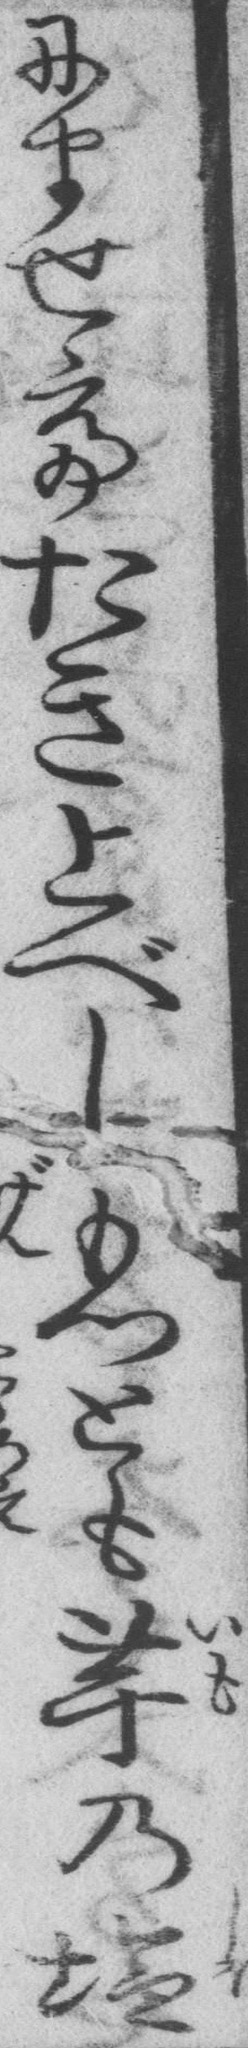丹ませ亭たき上べしもつとも芋乃塩
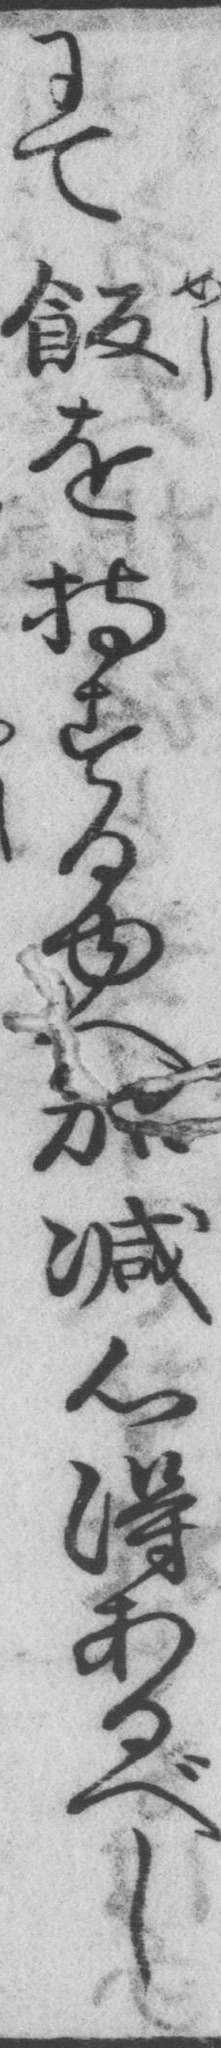尓て飯を持春るゆへ加減心得あるべし
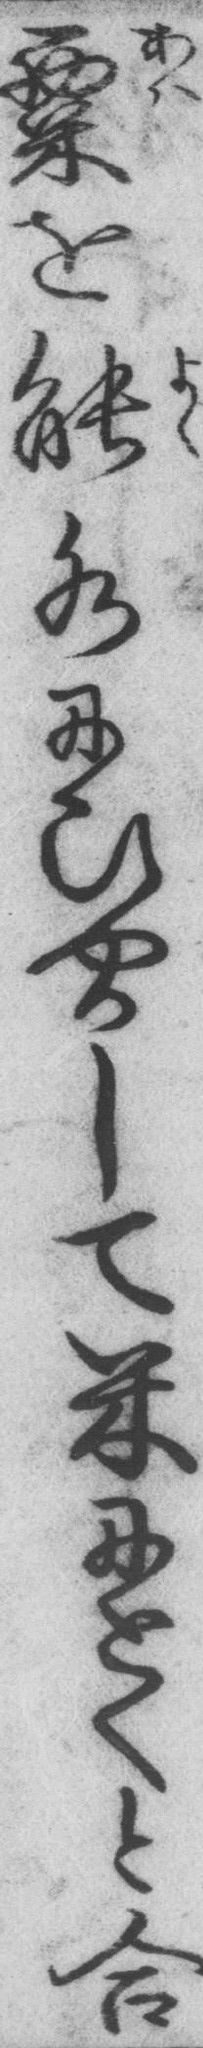粟を能水丹ひやかして米丹とくと合
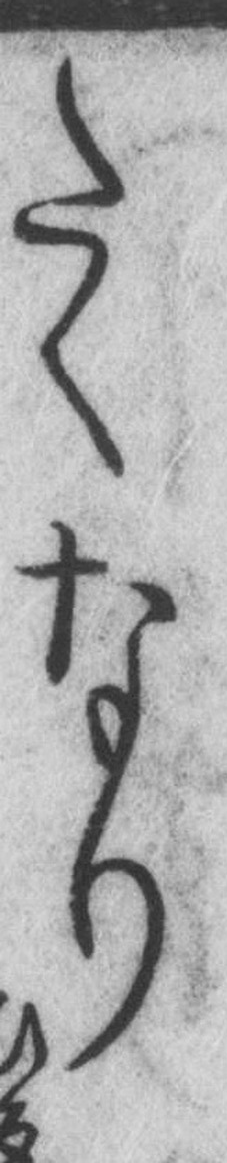たくなり
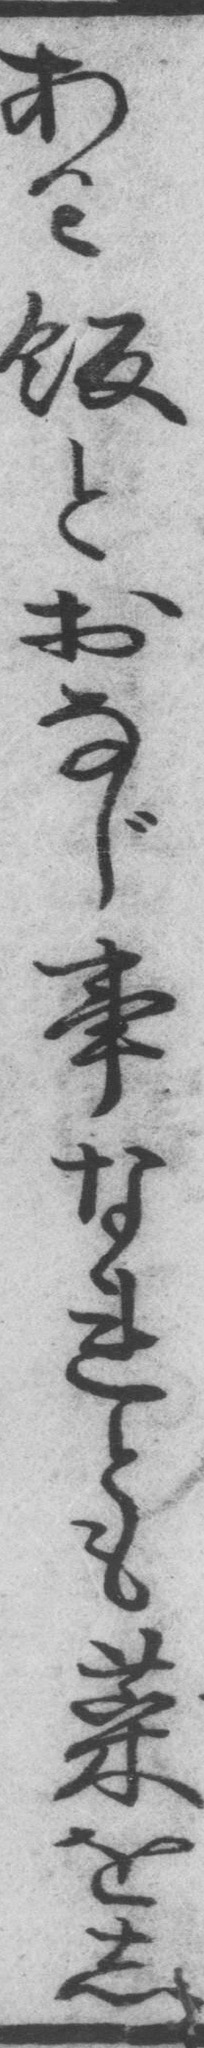あわ飯とおなじ事な連とも菜を志
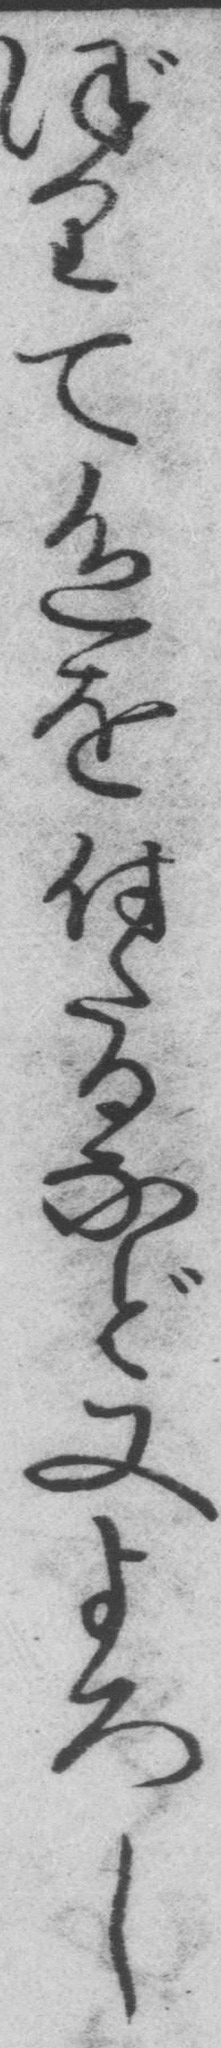ぼ里て色を付たるなど又よろし

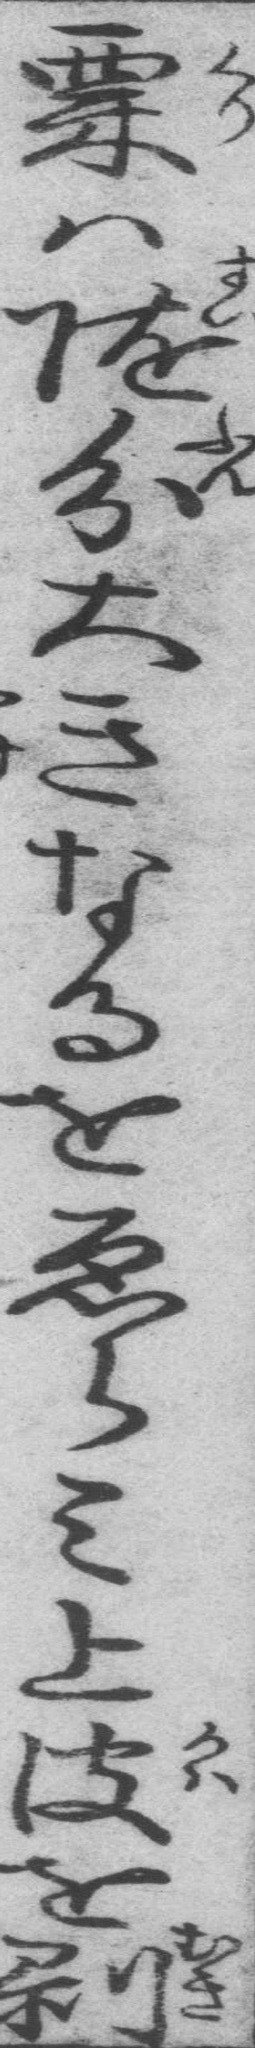栗は随分大きなるをゑらみ上皮を剥
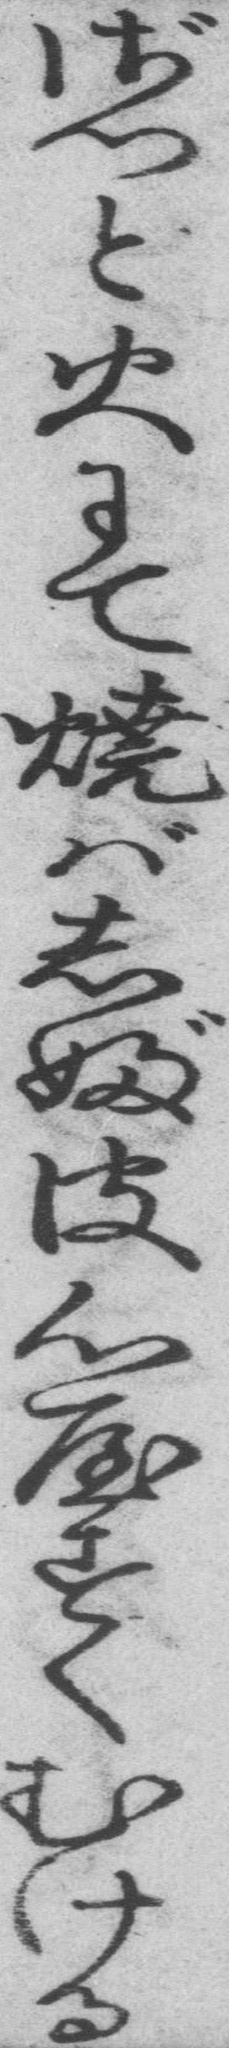ざつと火尓て焼ば志ぶ皮を心屋春くむける
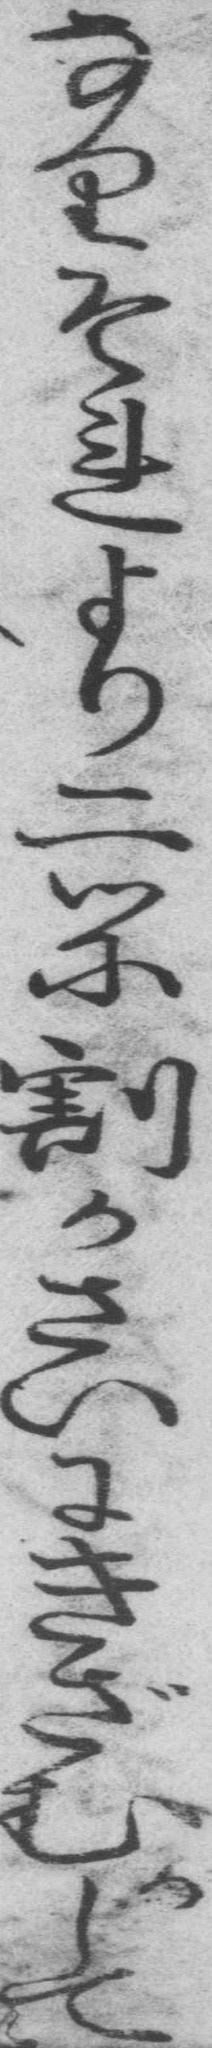な里そ連より二ツ尓割かさい尓きざむかして
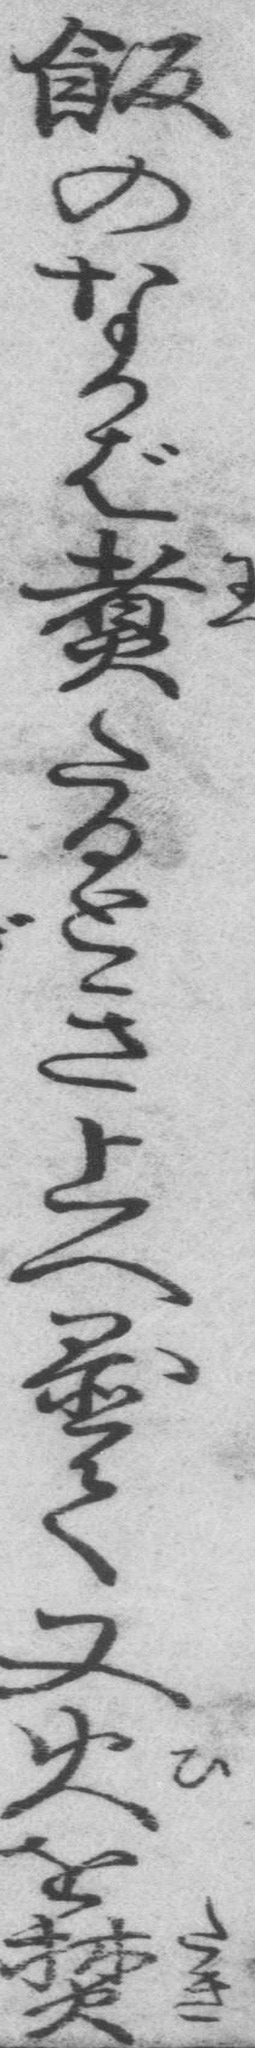飯のなかば煮たるとき上へ置て又火を焚
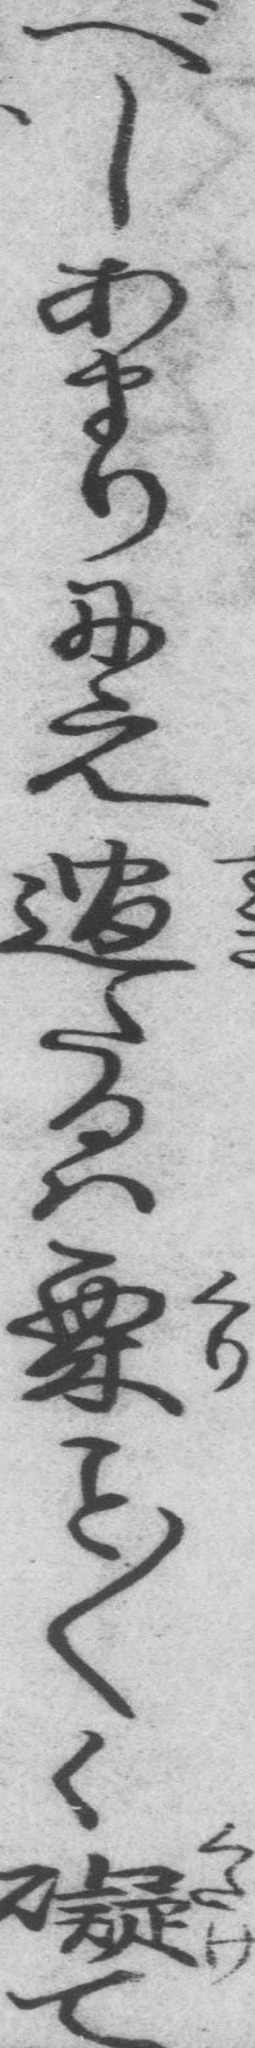べしあまり丹え過たるは栗こと〳〵く碎て
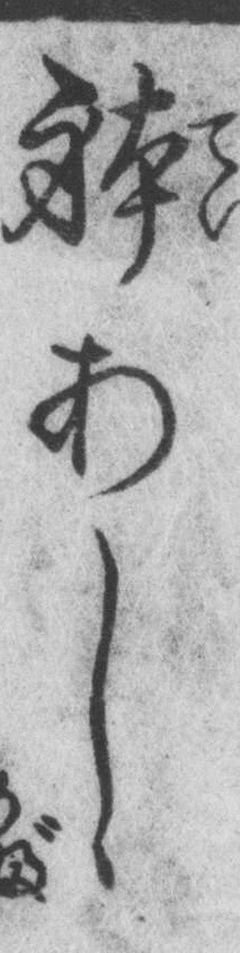躰あし
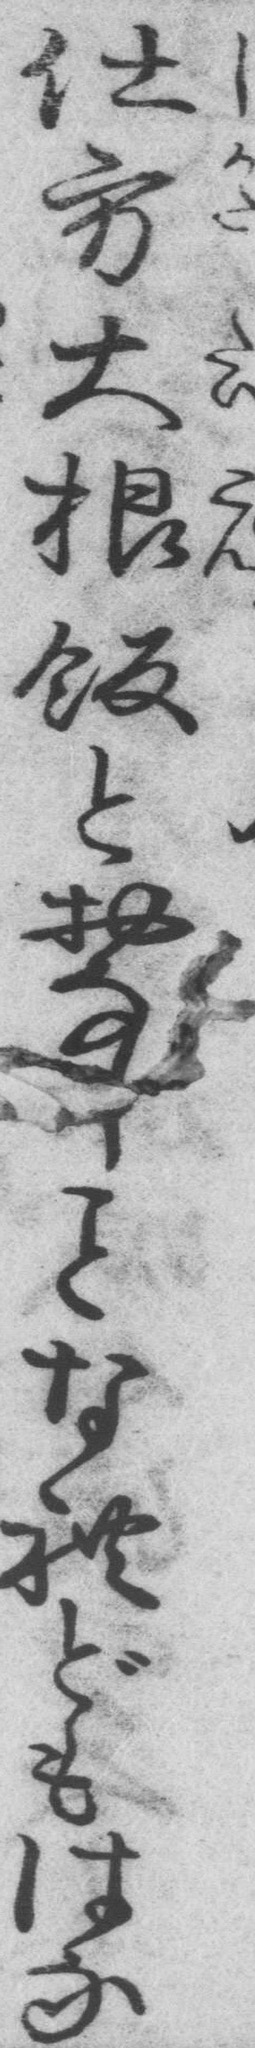仕方大根飯とおなじことな禮どもはな
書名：料理伊呂波庖丁
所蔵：大阪府立大学学術情報センター 国文学研究資料館
